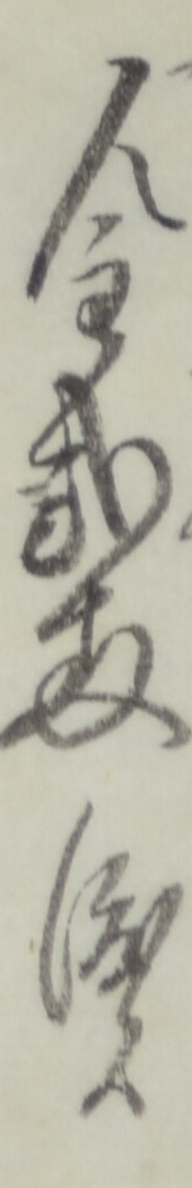金弐両渡ス
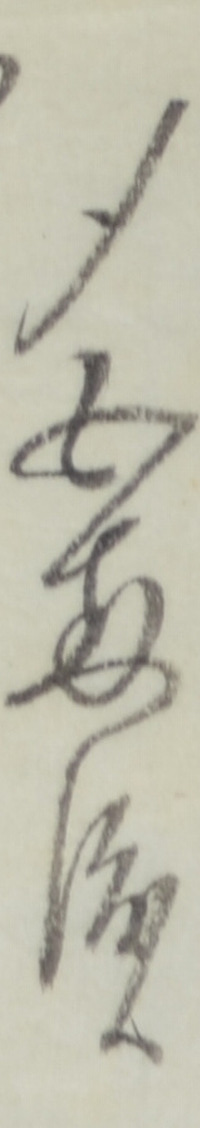〆五両渡ス
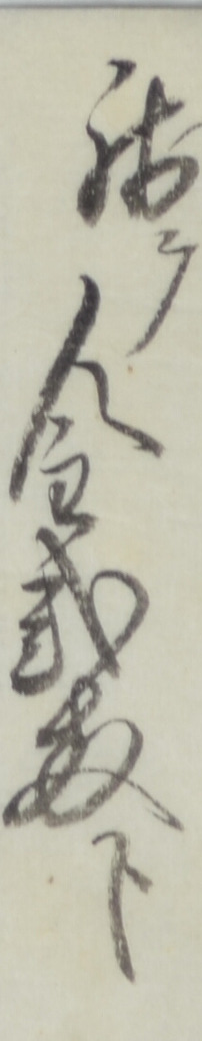残テ金弐両ト
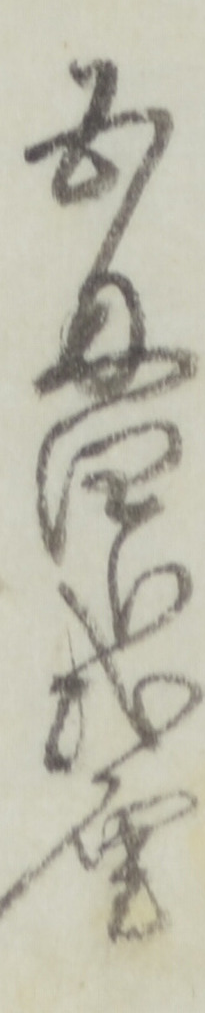五匁四分弐厘
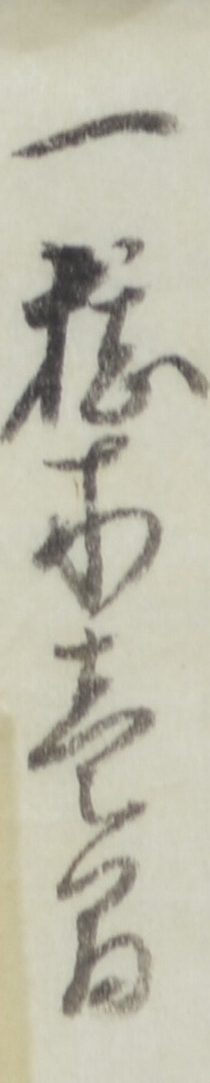一椹木壱間
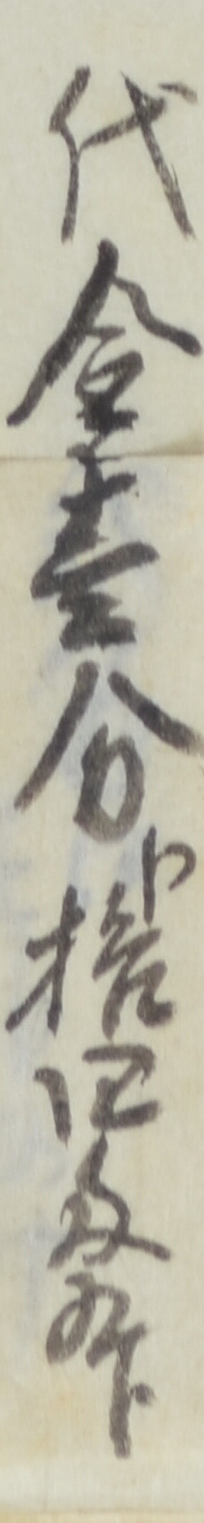代金壱分ト拾四匁九分
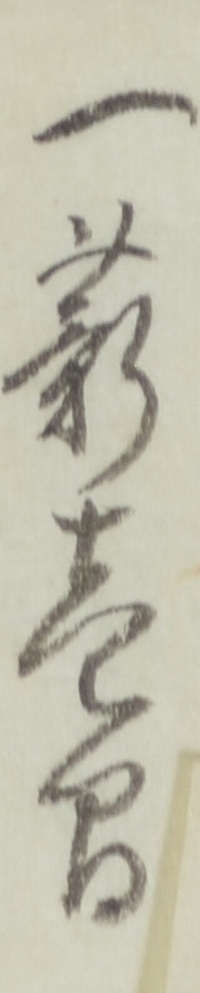一薪壱間
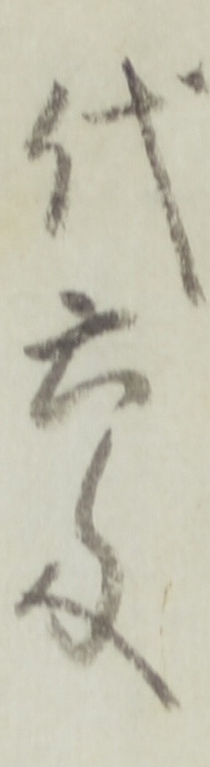代六匁
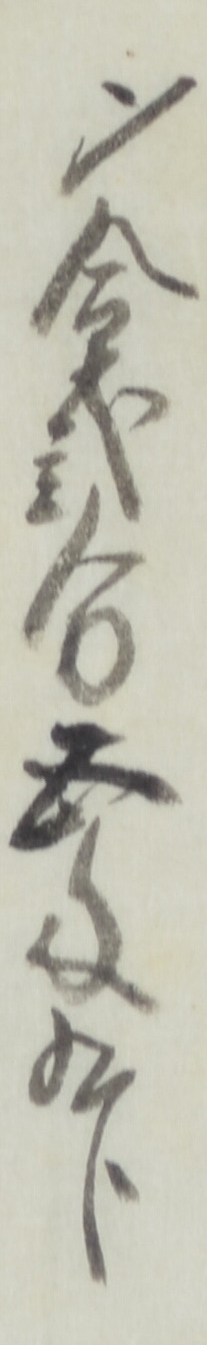〆金弐分五匁九分
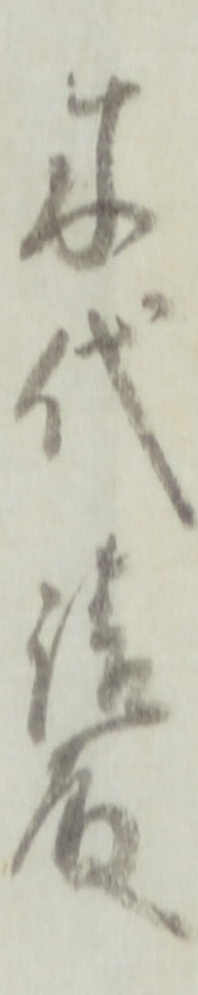木代請取
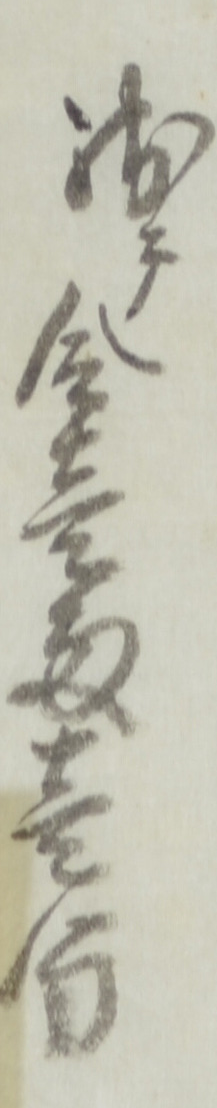残テ金壱両壱分
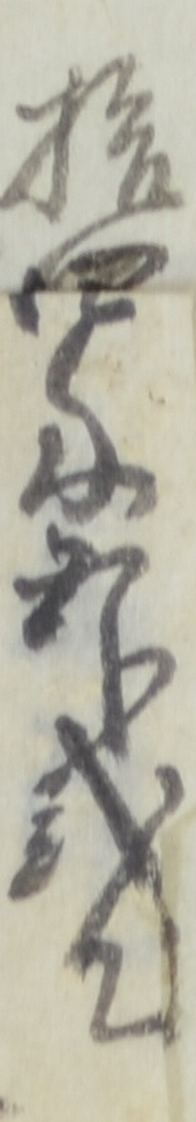拾四匁五分弐厘
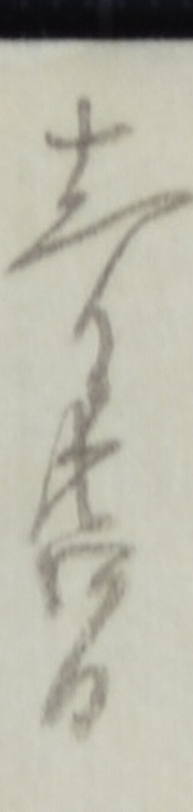十二月廿四日
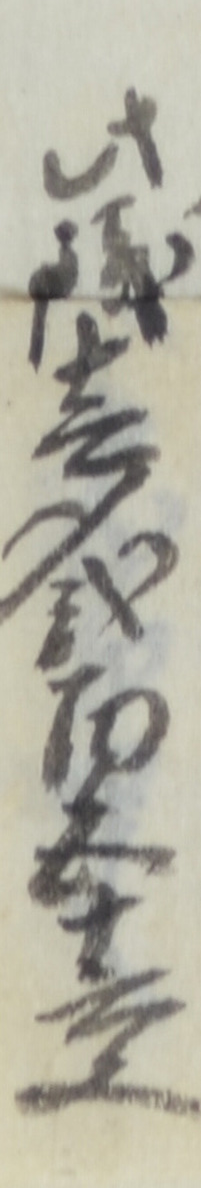此銭壱貫弐百五十六文
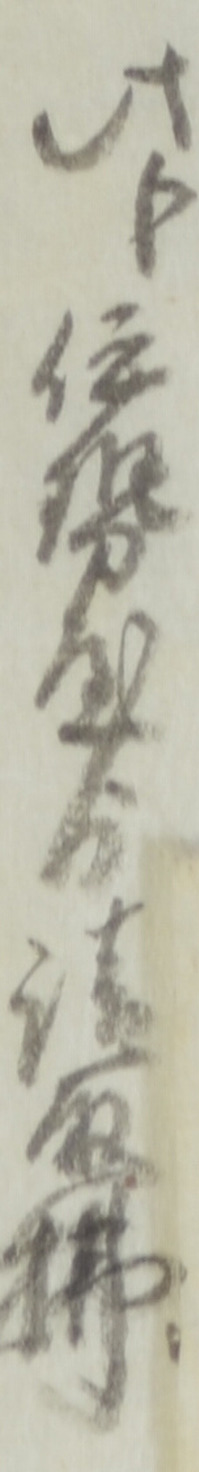此分伊勢屋ゟ請取払

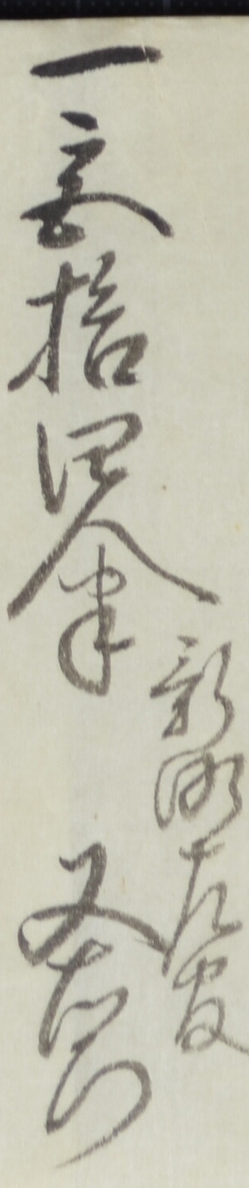一宮拾四人半又右衛門
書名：権現分拂方
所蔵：伊那市立高遠町図書館・合同会社AMANE
